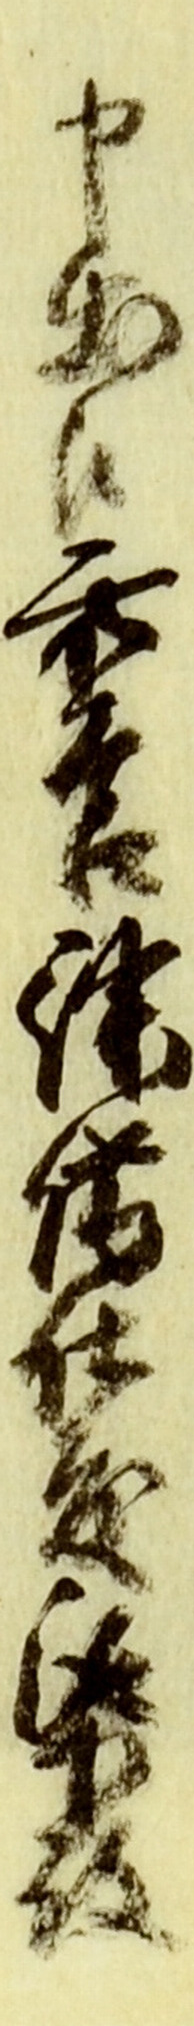申出候此節拝借仕度趣下役
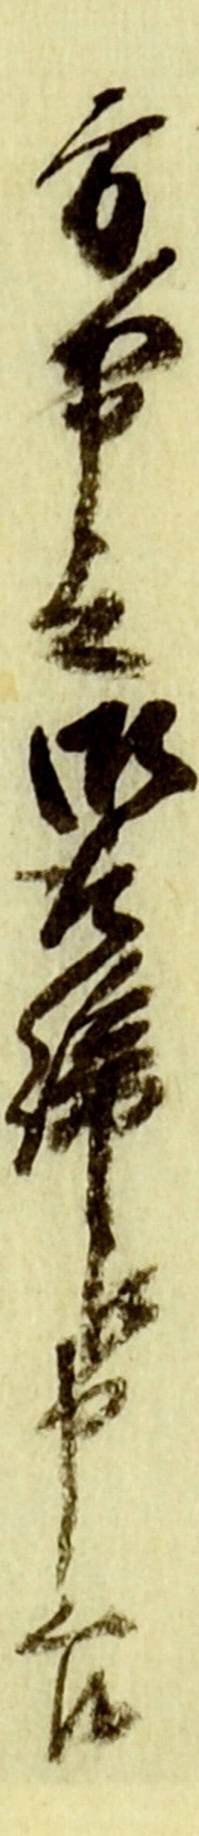方ゟ申立御取締江申上候
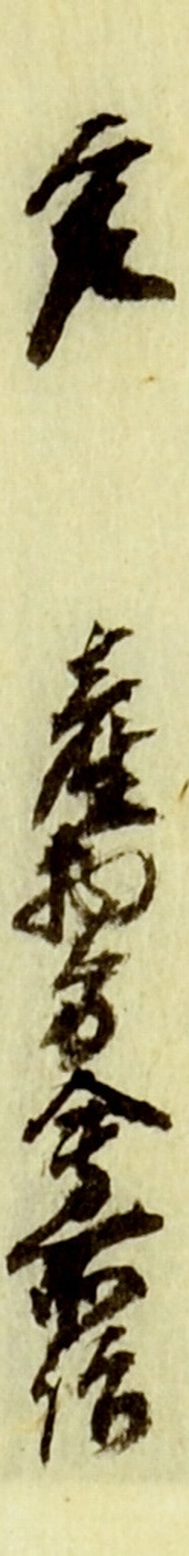覚産物方会所詰
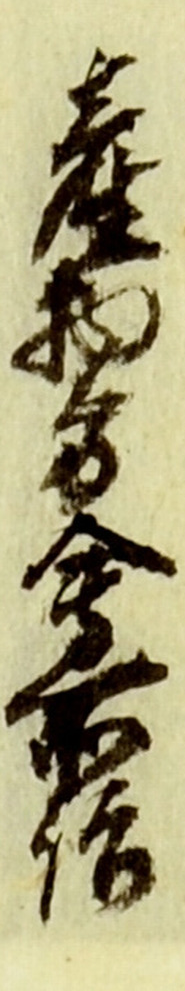覚産物方会所詰
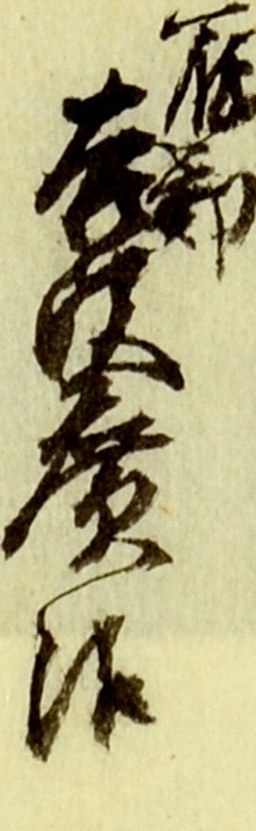吉沢廣治
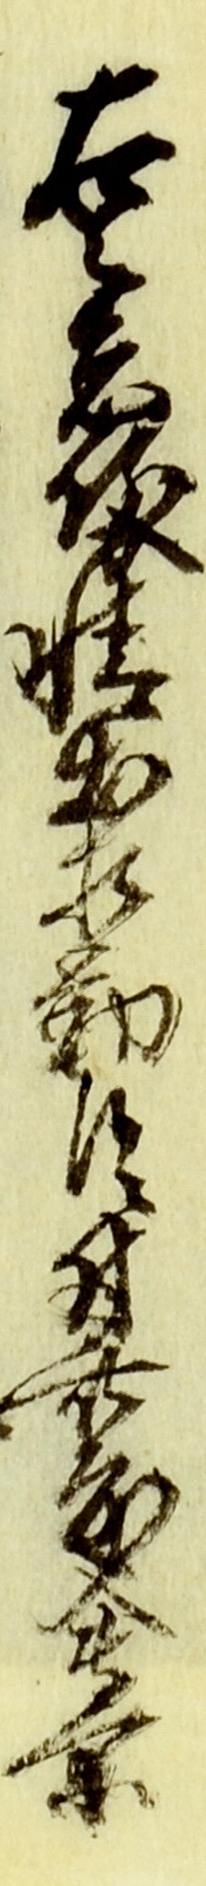右之者儀情出相勤候ニ付此度会所
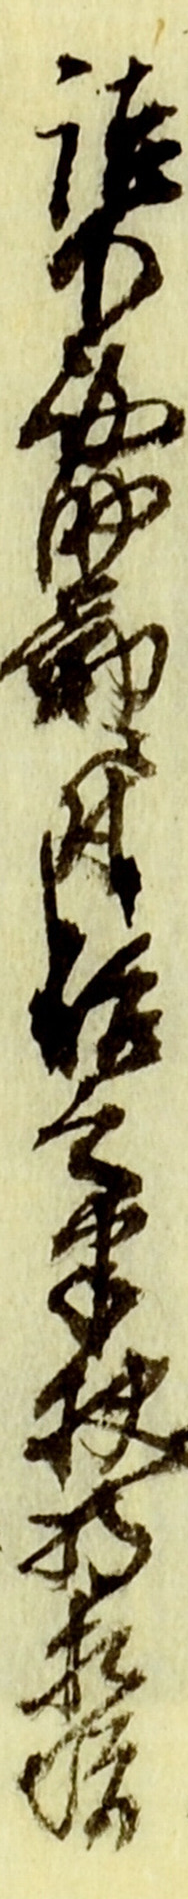詰下役助勤ニ付詰之半扶持相増
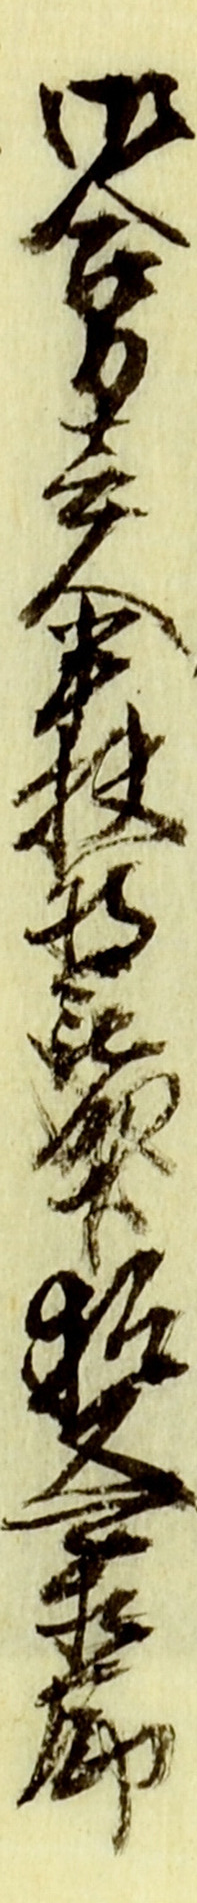御合力壱人半扶持被成下猶又可相励
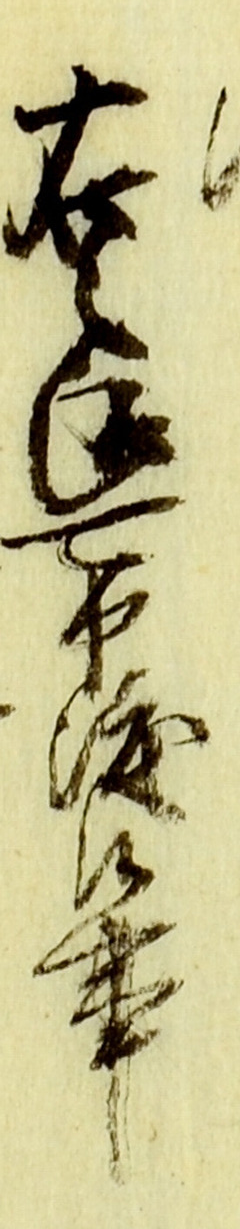右之趣可申渡候事
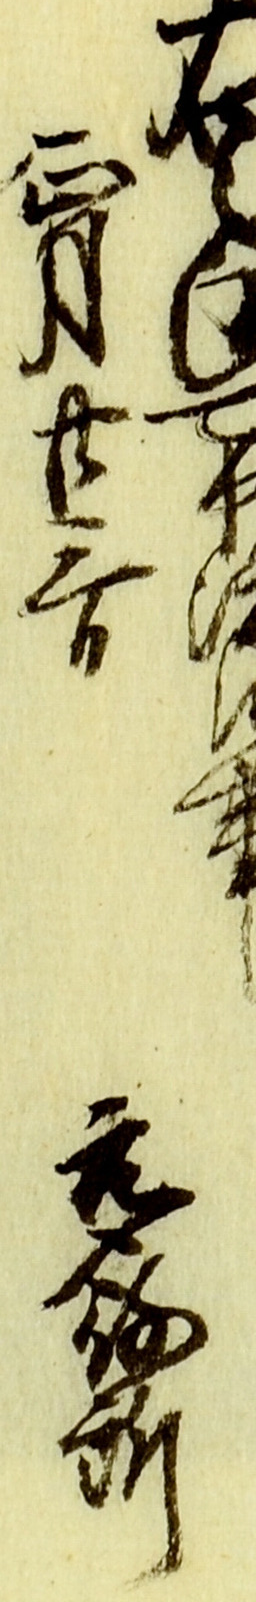正月廿三日元〆役所
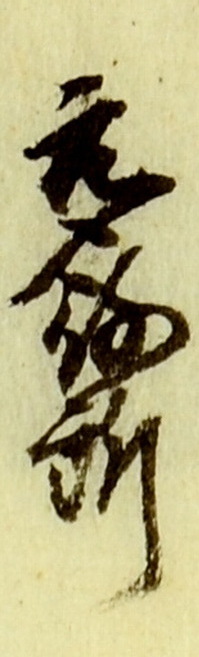元〆役所
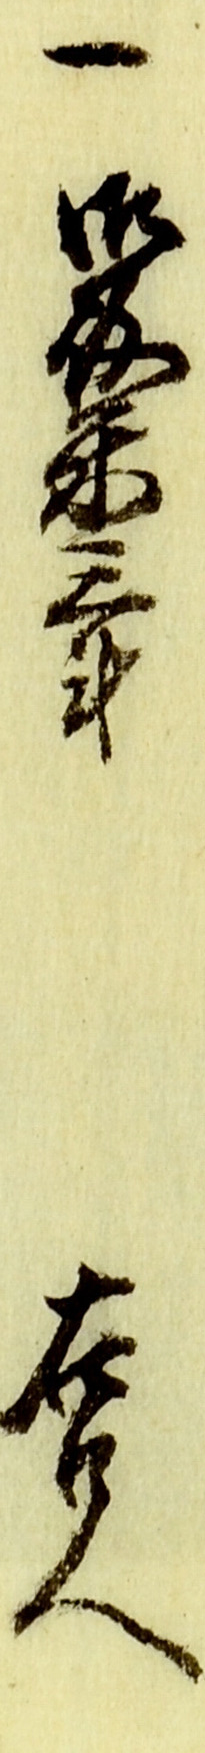一御役米三斗右同人
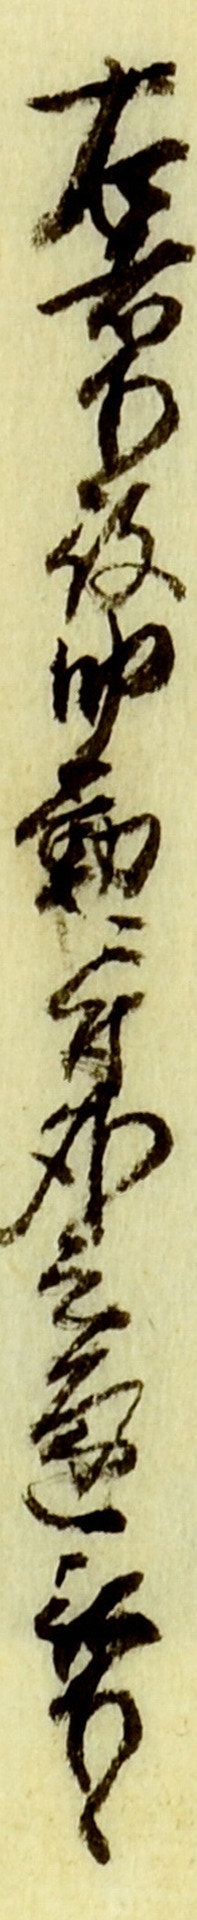右者下役助勤ニ付外之通被下候
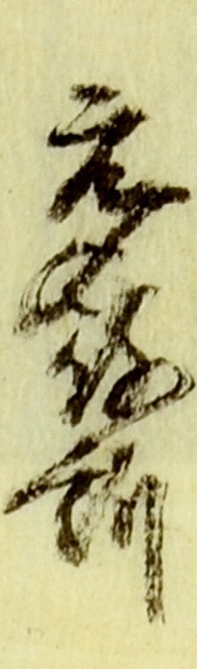元〆役所
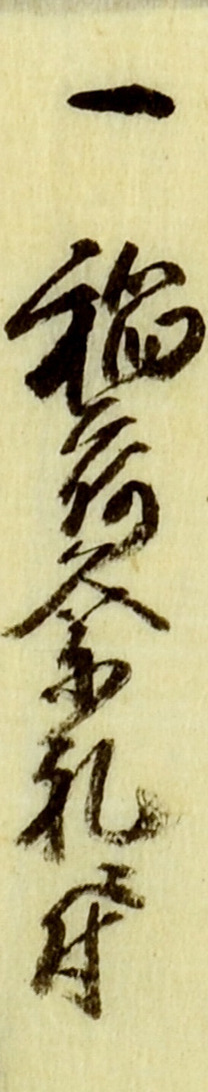一稲荷祭礼ニ付
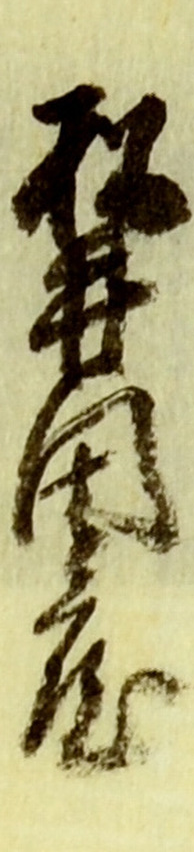松井周蔵
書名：諸事御用留
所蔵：伊那市立高遠町図書館・合同会社AMANE
